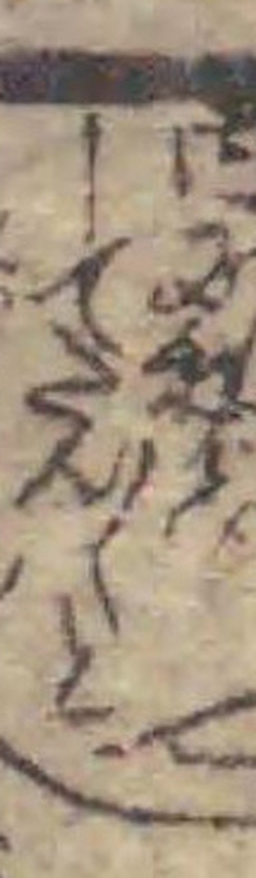してたん〳〵と
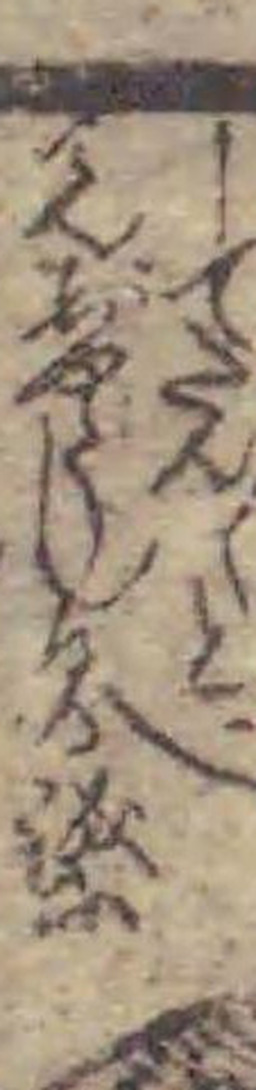はんじやうしける誠に
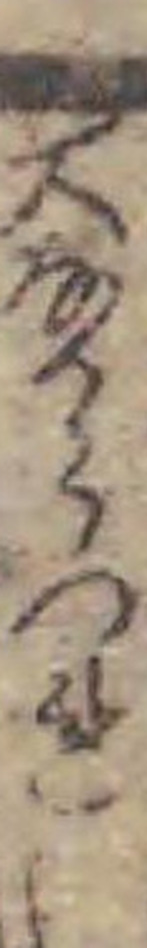二人なからつれ
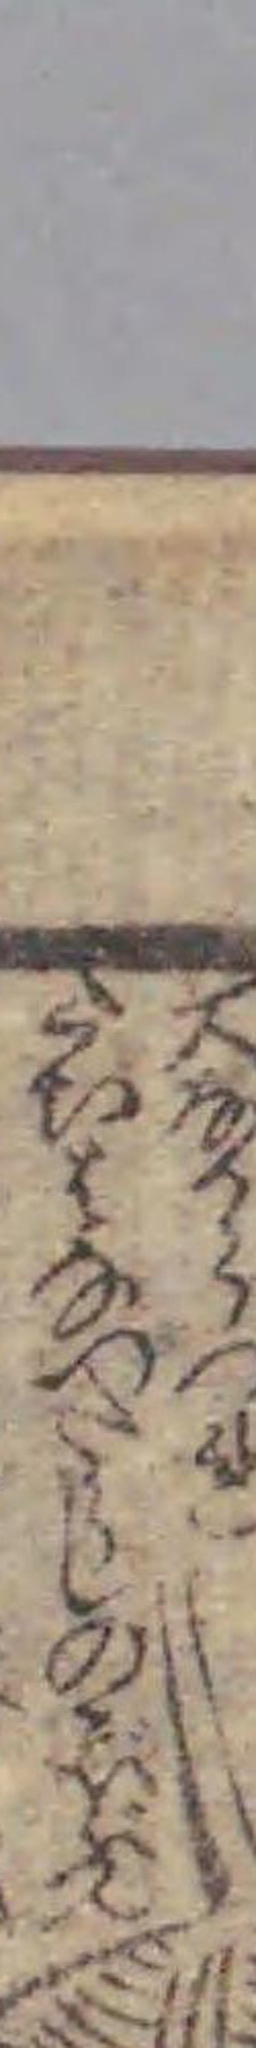たちはなつたらしのじぶん
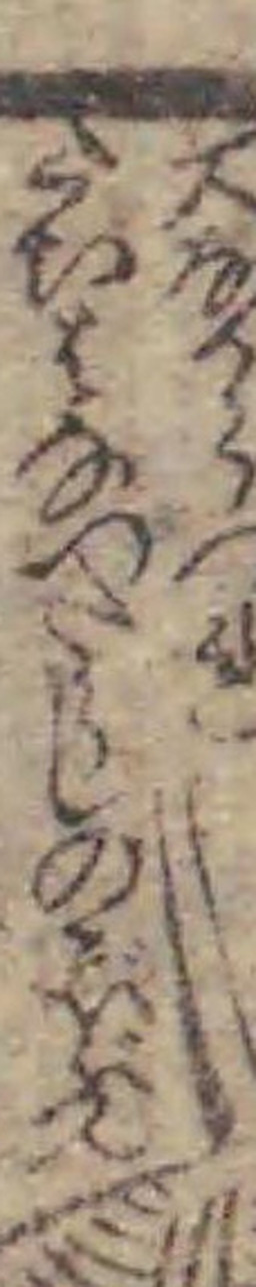たちはなつたらしのじぶん
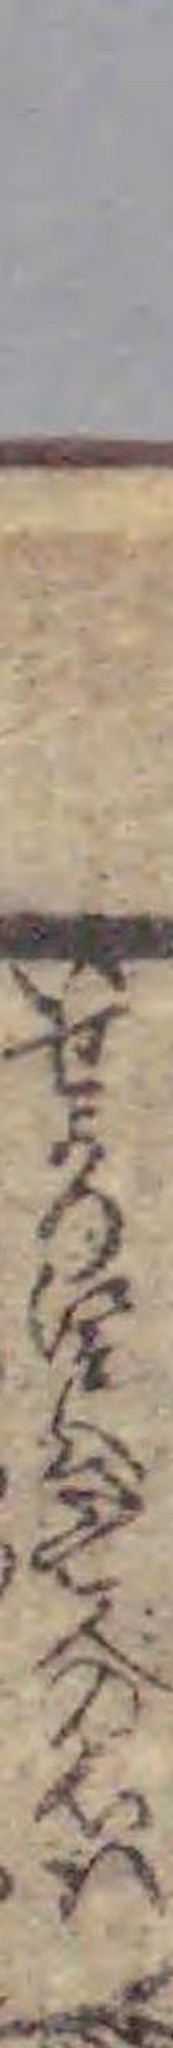いせより江戸へきてひとの心は
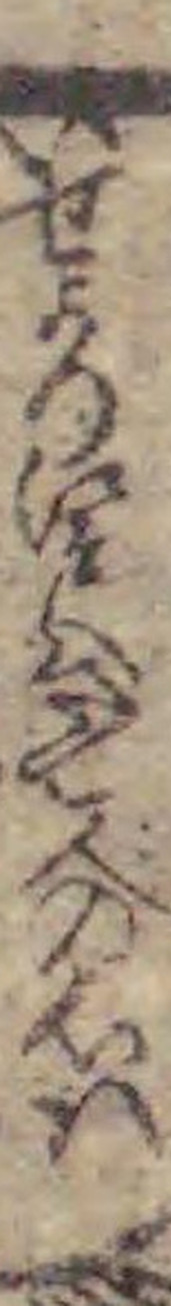いせより江戸へきてひとの心は
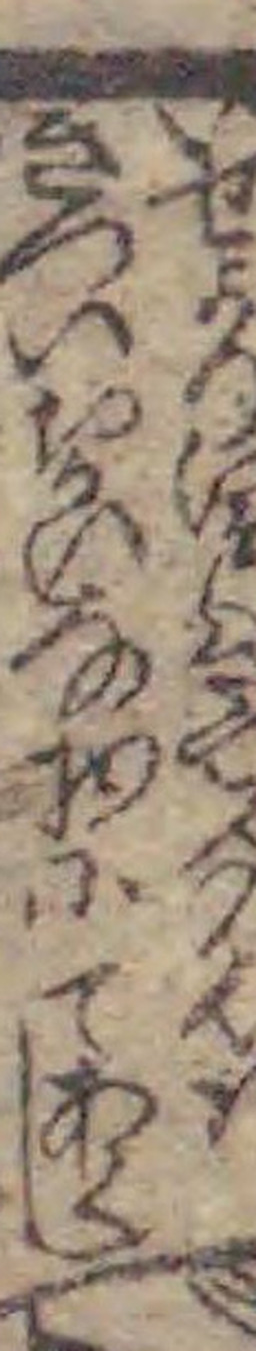きついちかいな物にてあくし
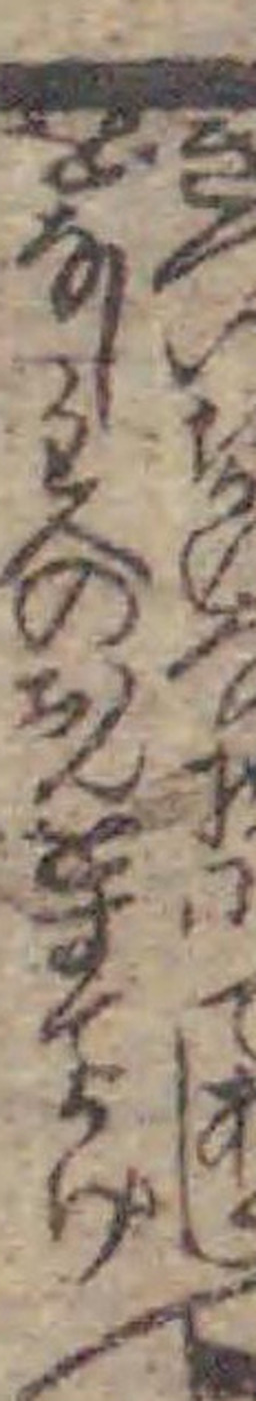をなし主人のおんをすてかけ
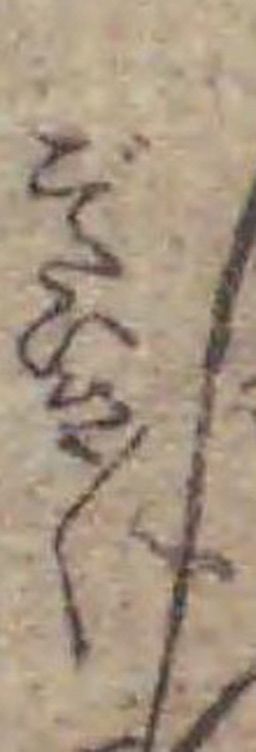ごたいき〳〵
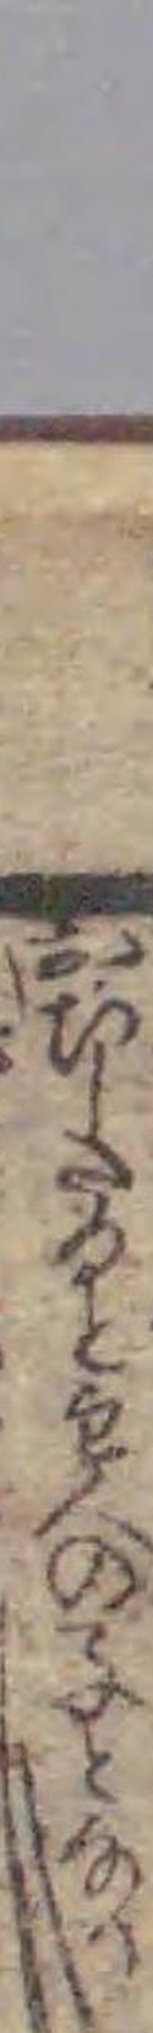おちしたると主人の子となり
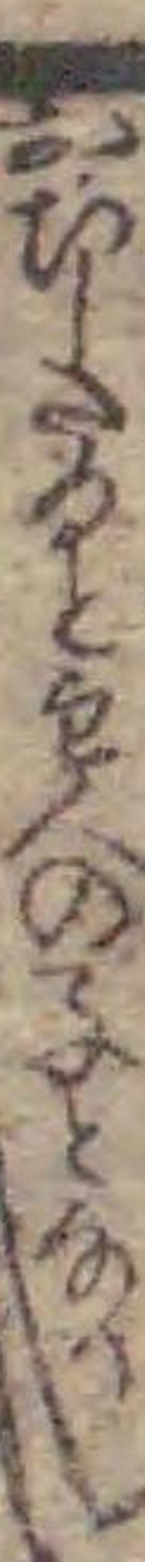おちしたると主人の子となり
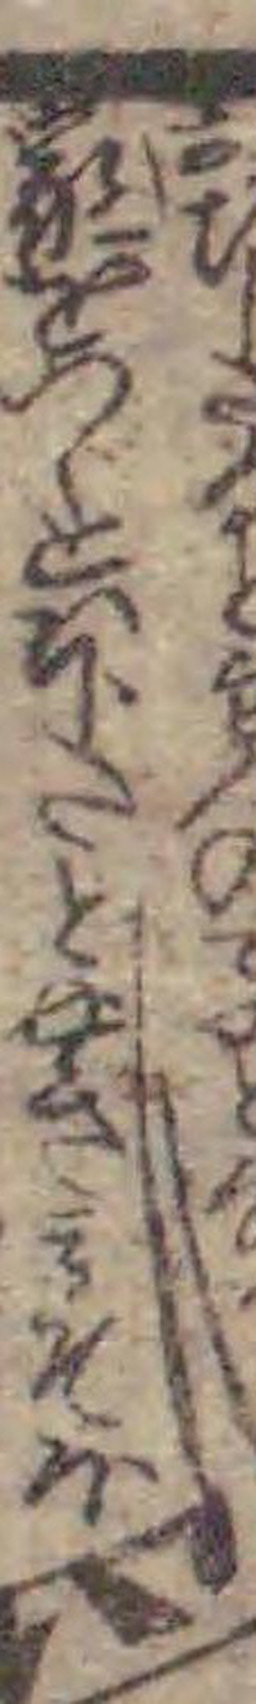家をつぐとは下たとやきみそほ
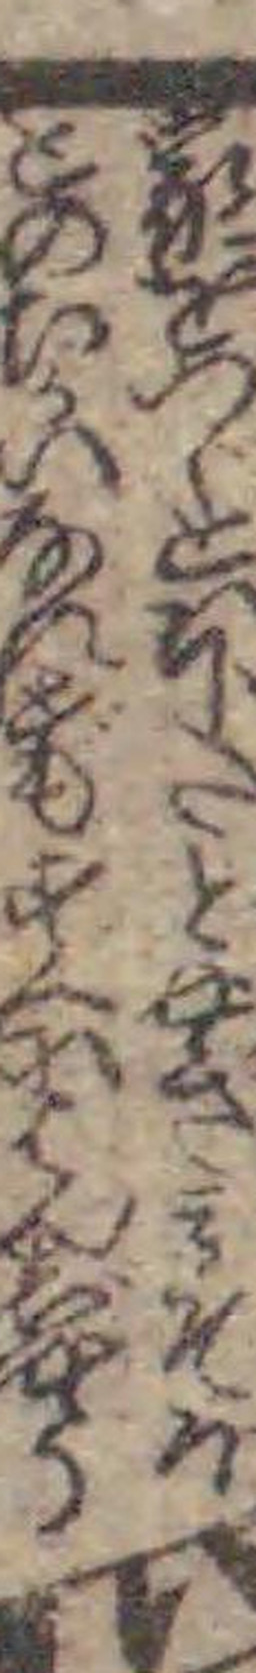どのちかいなれどもすへにはんぢやう
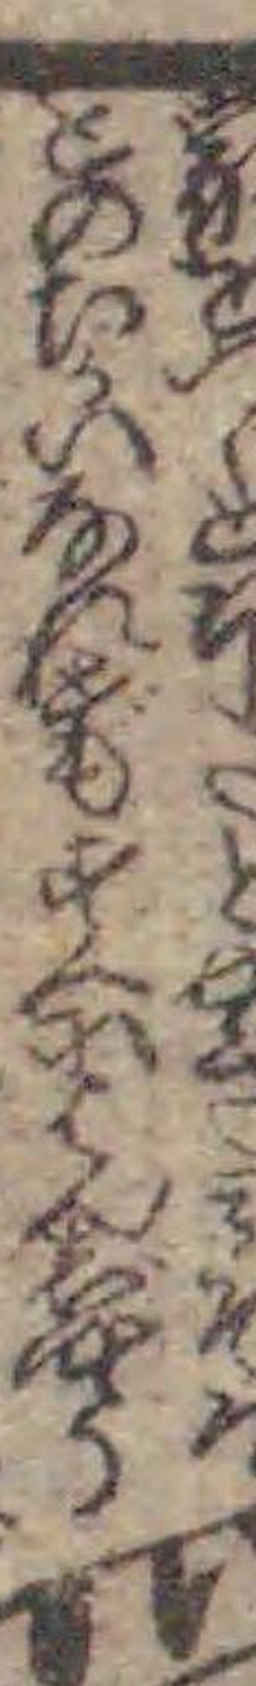どのちかいなれどもすへにはんぢやう
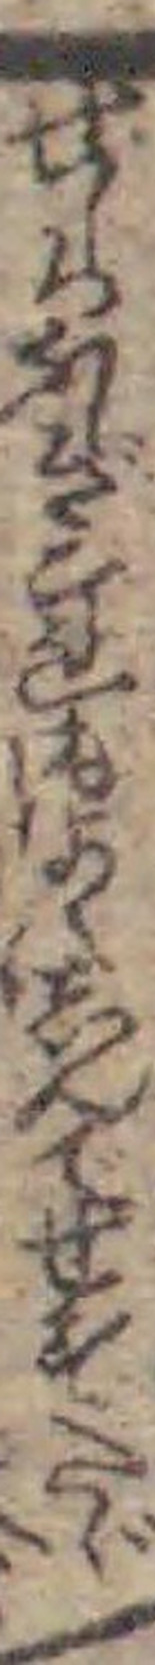せしはふしぎこれもよくしんでせすたゞ
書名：通風伊勢物語 : 3巻
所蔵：国立国会図書館 National Diet Library, JAPAN
